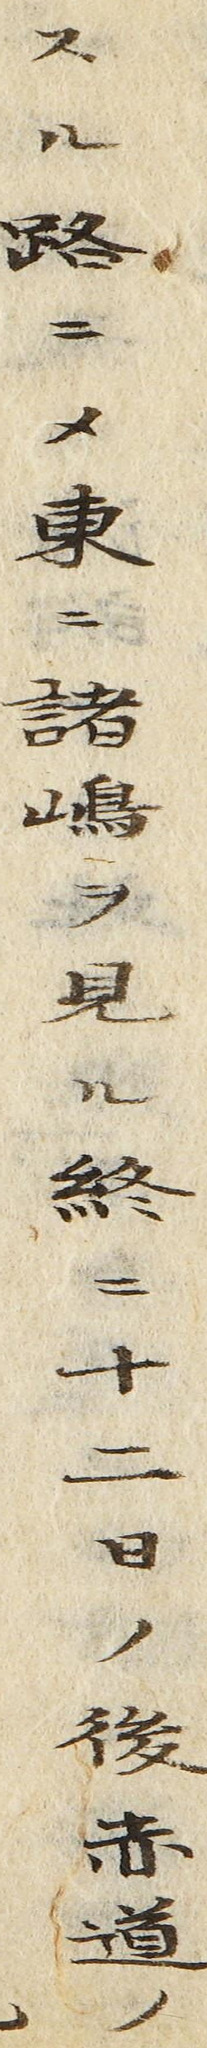スル路ニシテ東ニ諸島ヲ見ル終ニ十二日ノ後赤道ノ
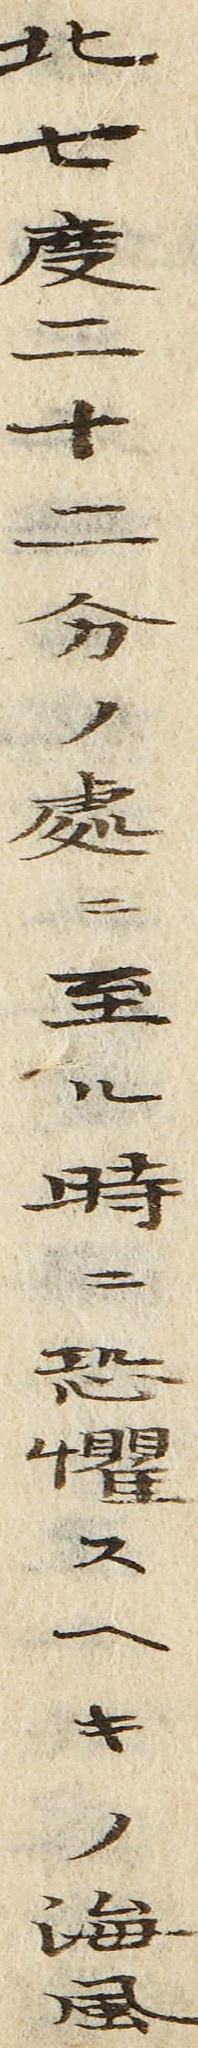北七度二十二分ノ処ニ至ル時ニ恐懼スヘキノ海風
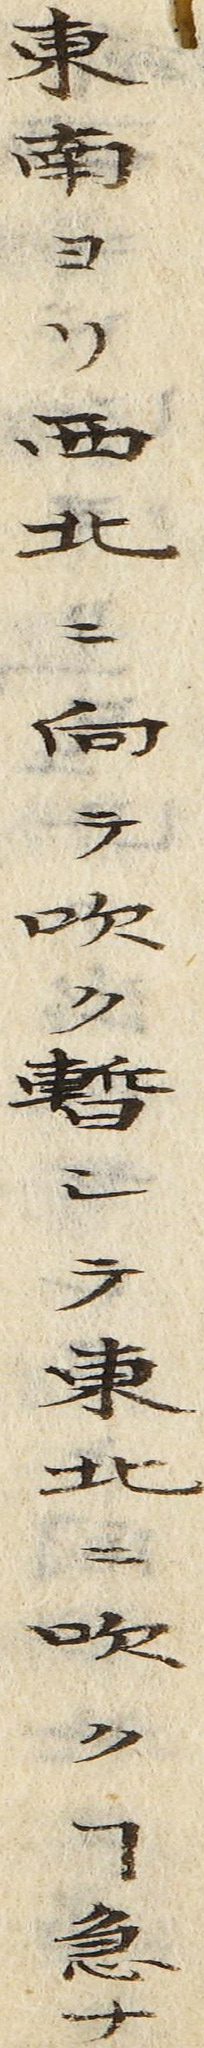東南ヨリ西北ニ向テ吹ク暫シテ東北ニ吹クコト急ナ
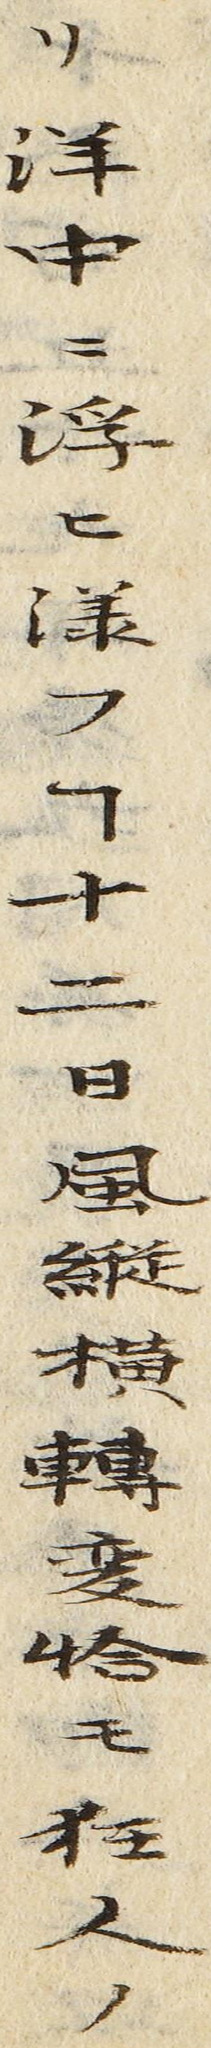リ洋中ニ浮ヒ漾フコト十二日風縦横転変恰モ狂人ノ
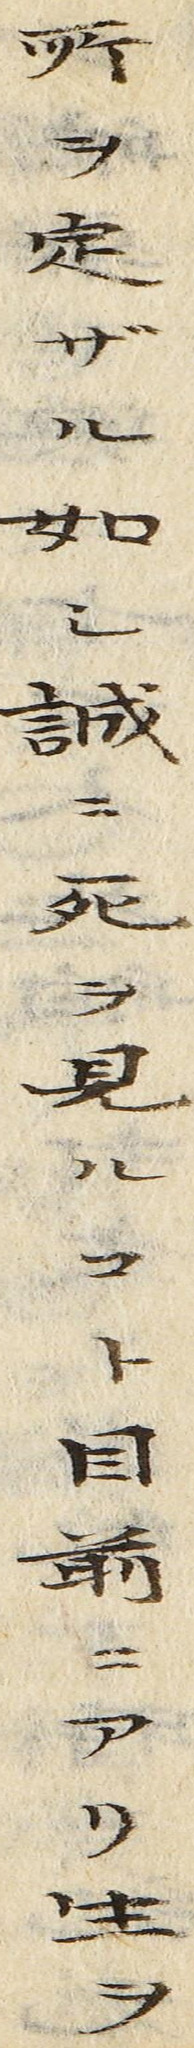所ヲ定ザル如シ誠ニ死ヲ見ルコト目前ニアリ生ヲ
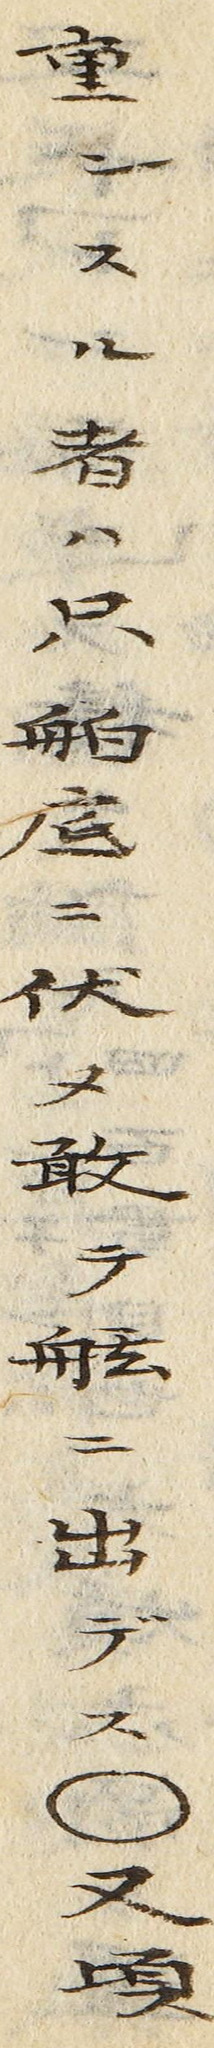重ンスル者ハ只舶底ニ伏シテ敢テ舷ニ出デス◯又頃
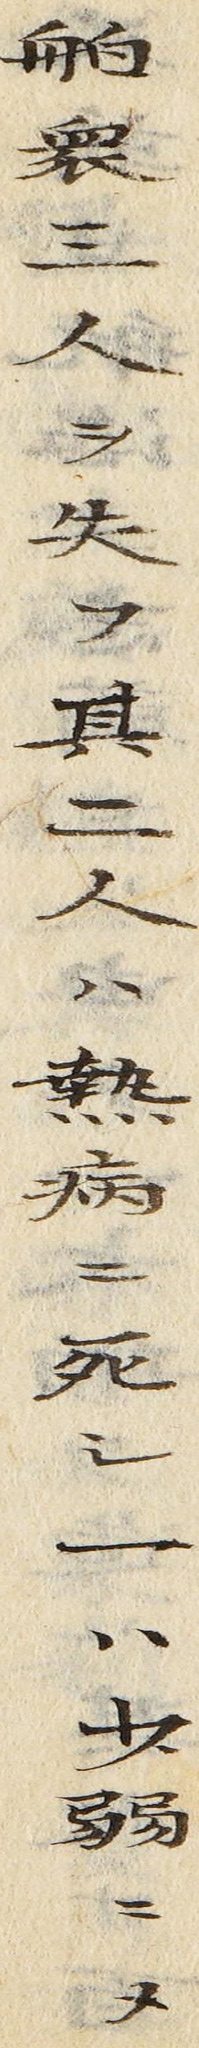舶衆三人ヲ失フ其二人ハ熱病ニ死シ一ハ少弱ニシテ
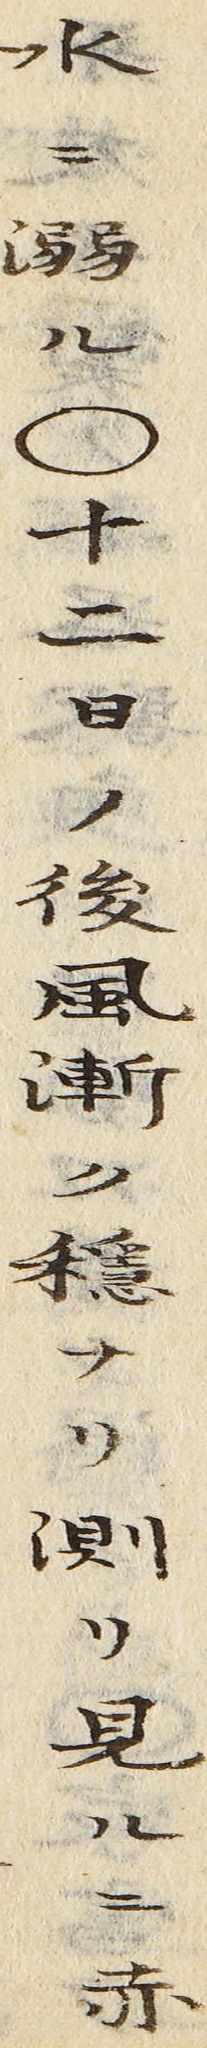水ニ溺ル◯十二日ノ後風漸ク穏ナリ測リ見ルニ赤
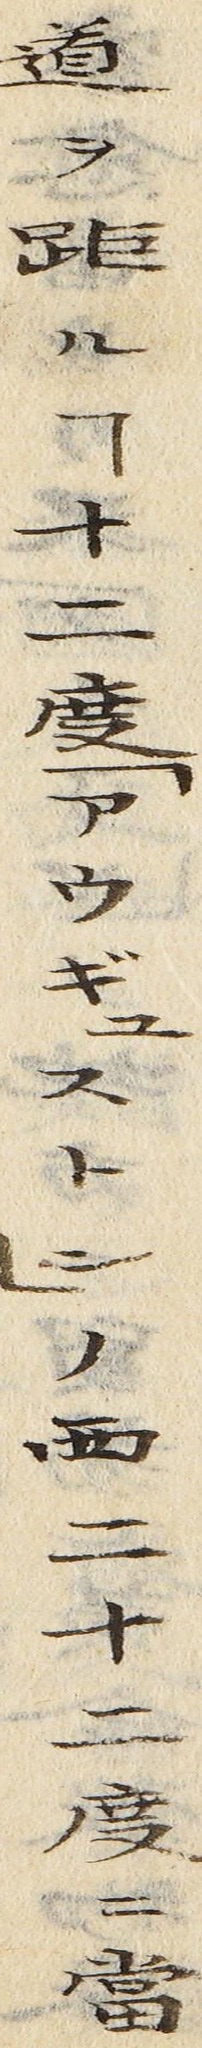道ヲ距ルコト十二度「アウギユストン」ノ西二十二度ニ当
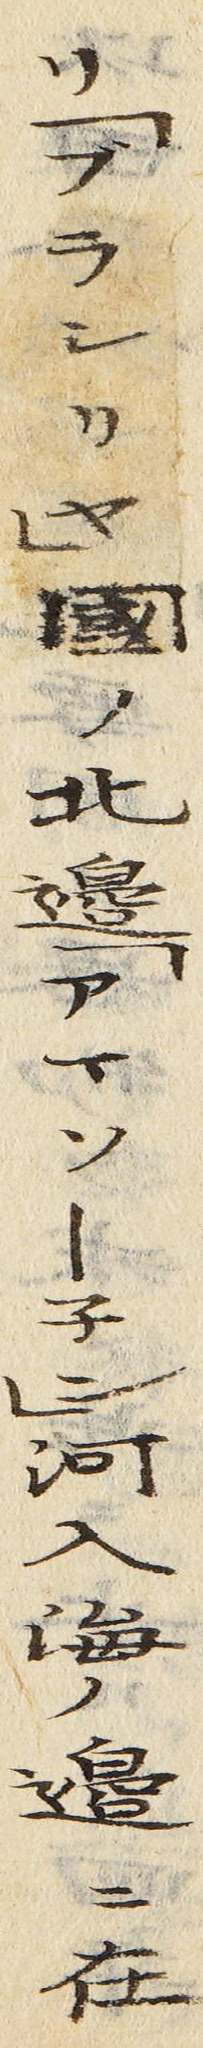リ「ブラシリヤ」国ノ北辺「アマソーネン」河入海ノ辺ニ在
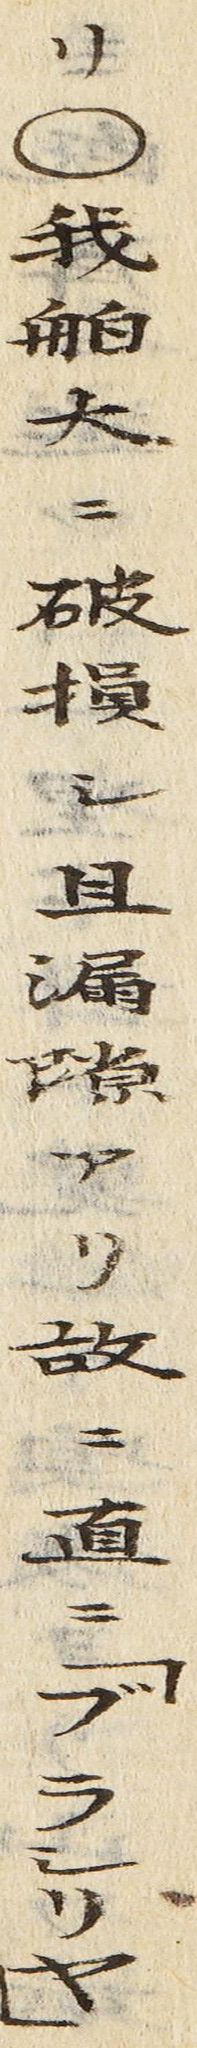リ◯我舶大ニ破損シ且漏隙アリ故ニ直ニ「ブラシリヤ」
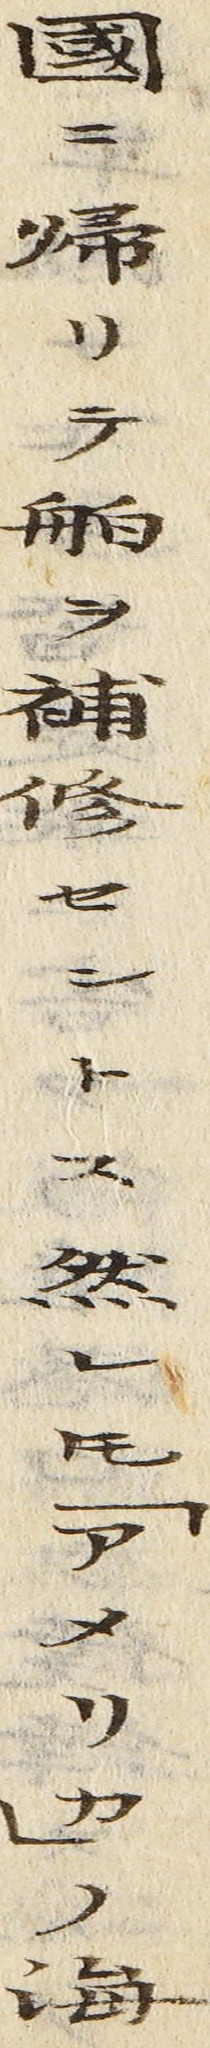国ニ帰リテ舶ヲ補修セントス然レトモ「アメリカ」ノ海
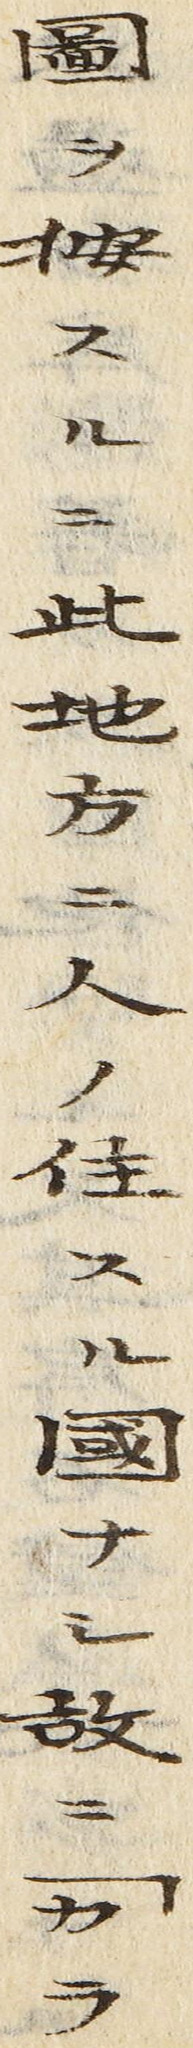図ヲ按スルニ此地方ニ人ノ住スル国ナシ故ニ「カラ
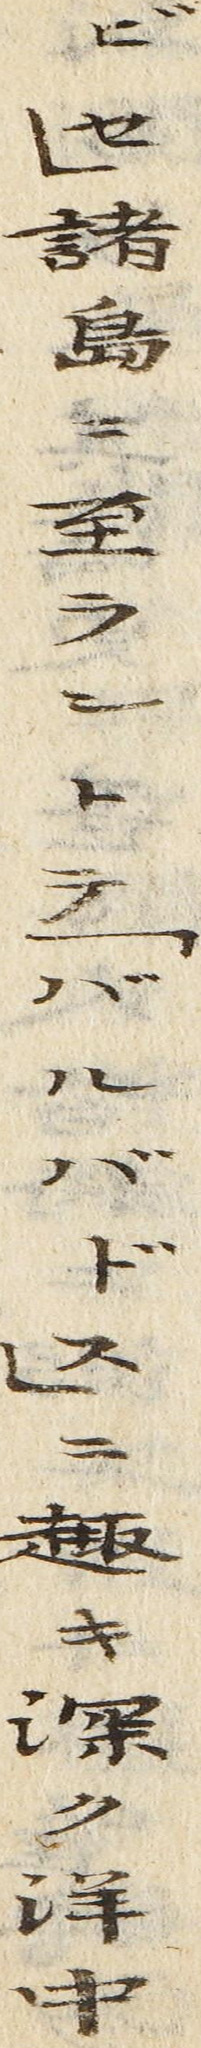ビセ」諸島ニ至ラントテ「バルバドス」ニ趣キ深ク洋中
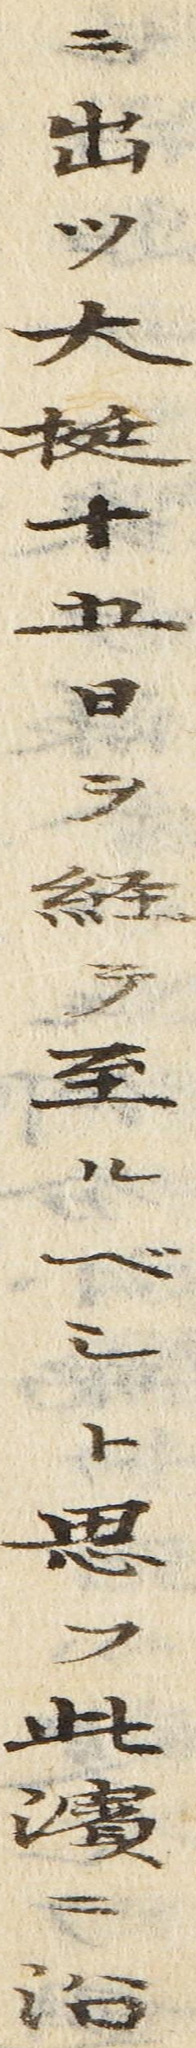ニ出ツ大挺十五日ヲ経テ至ルベシト思フ此浜ニ沿
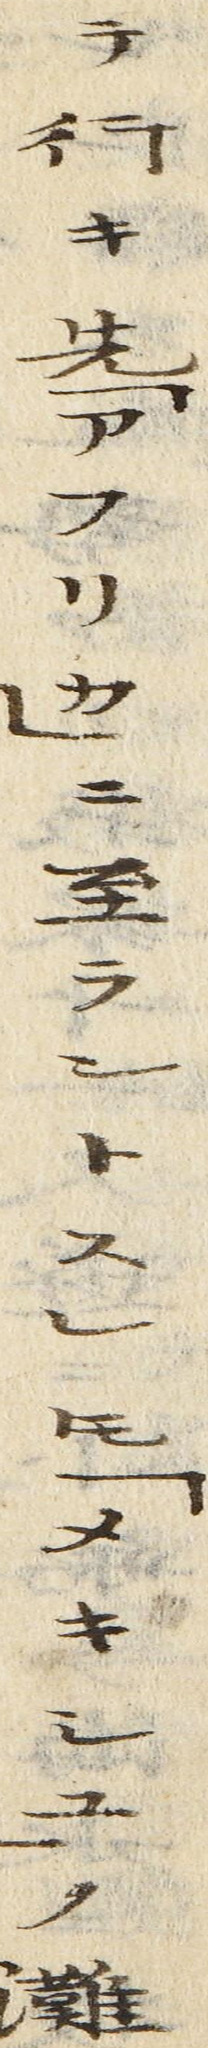テ行キ先「アフリカ」ニ至ラントスレトモ「メキシコ」ノ灘
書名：漂流紀事
